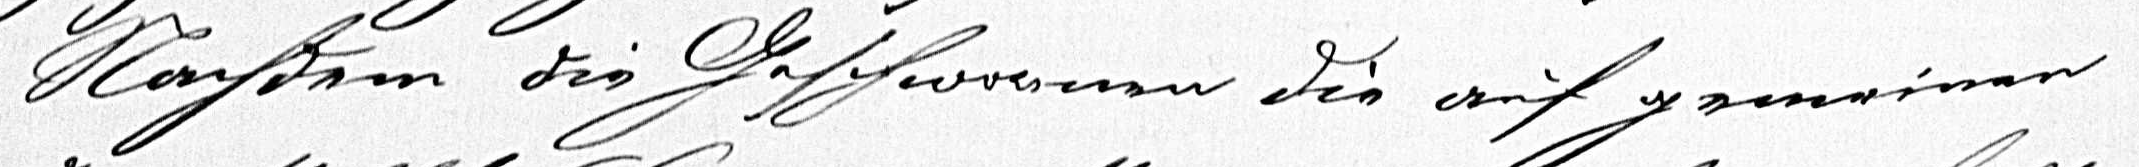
Nachdem die Geschworenen die auf gemeinen
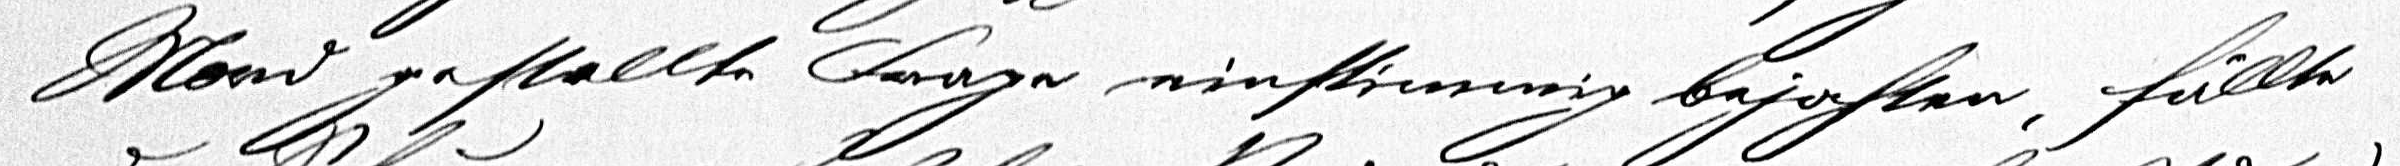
Mord gestellte Frage einstimmig bejahten fällte
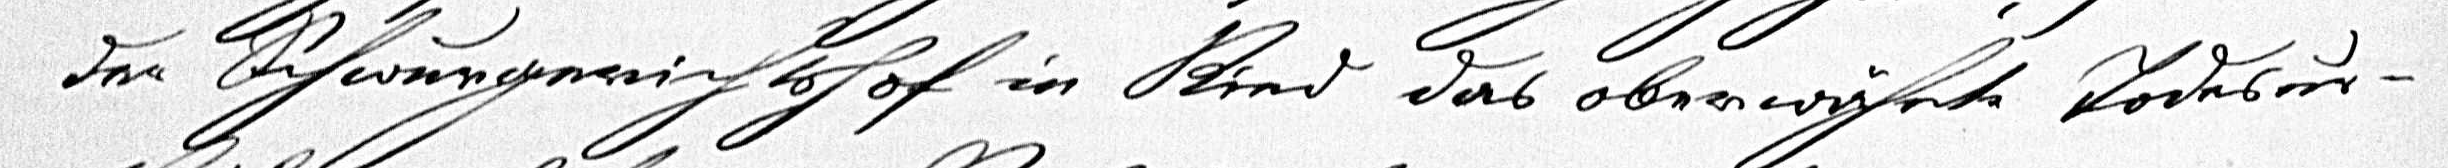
der Schwurgerichtshof in Ried das oberwähnte Todesur¬
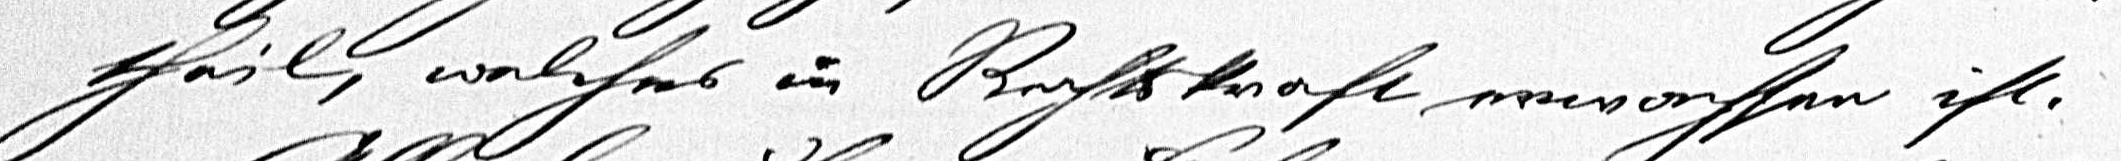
theil, welches in Rechtskraft erwachsen ist.
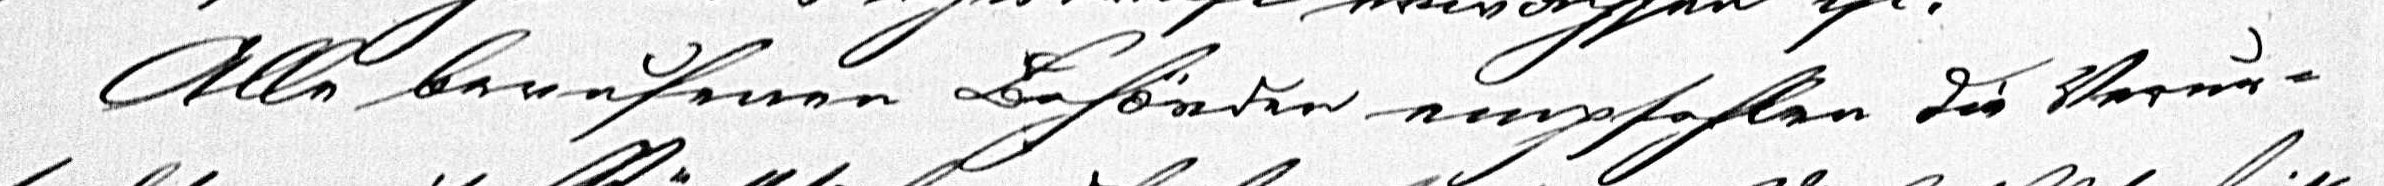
Alle berufenen Behörden empfohlen die Verur¬
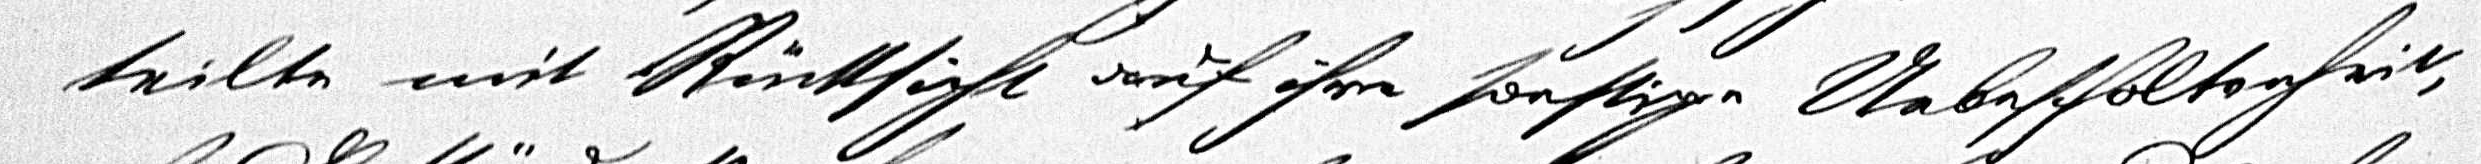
teilte mit Rücksicht auf ihre sonstige Unbescholtenheit,
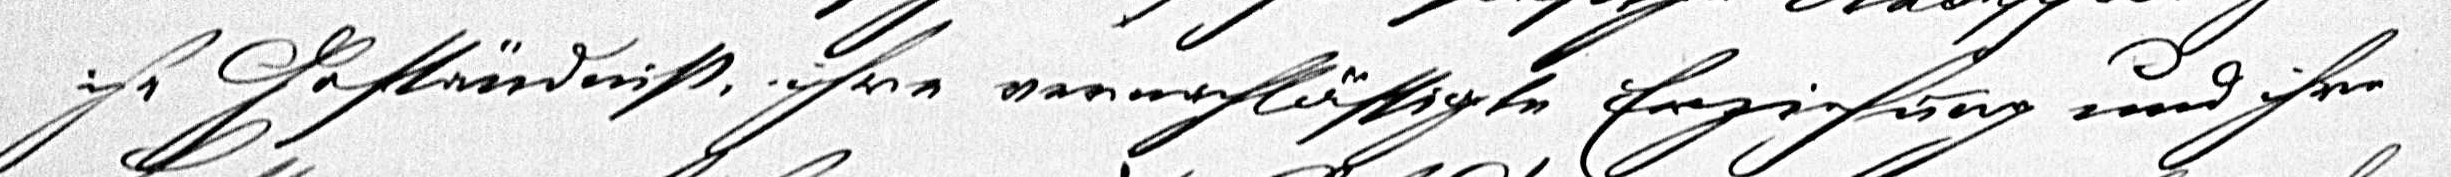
ihr Geständniß, ihre vernachlässigte Erziehung und ihre
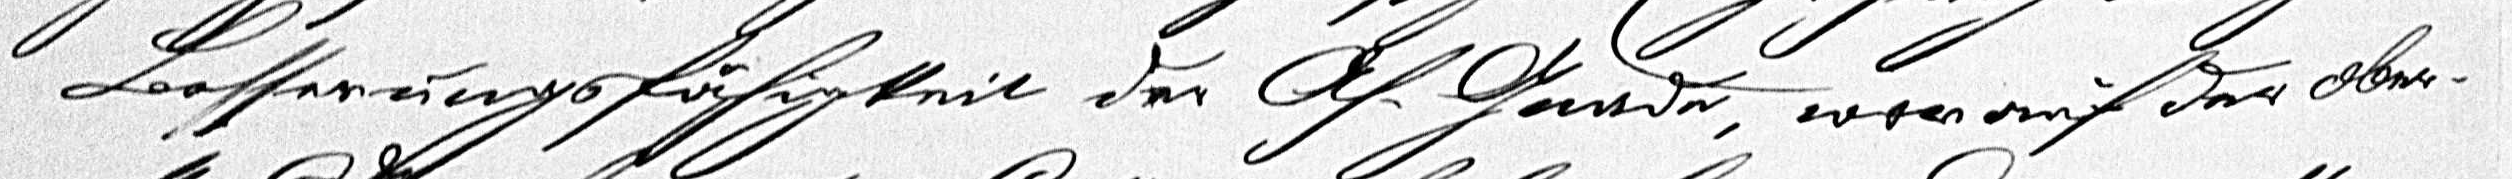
Besserungsfähigkeit der Ah. Gnade, war auf der ober¬
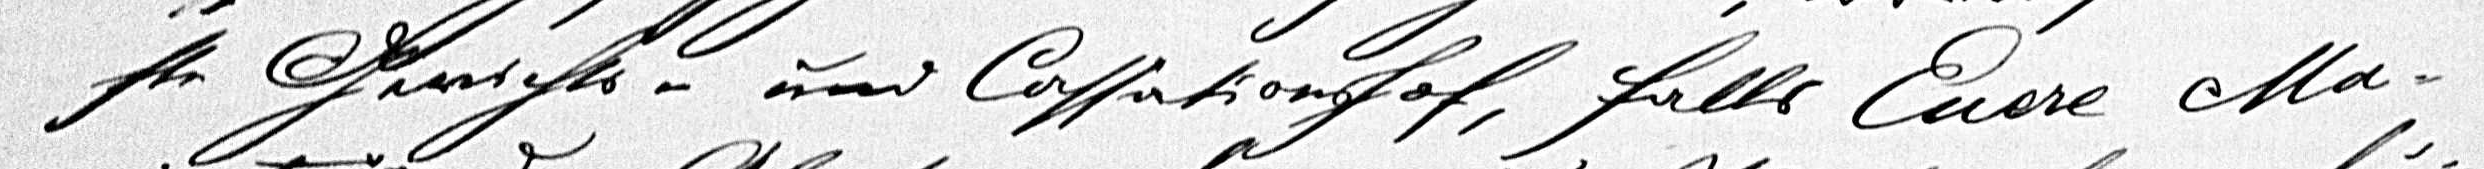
ste Gerichts- und Cassationshof, falls Euere Ma¬
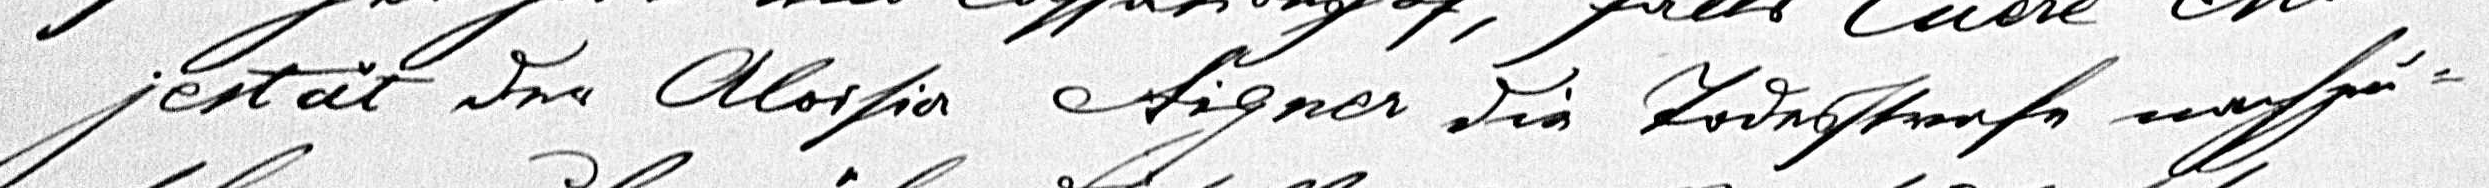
jestät der Aloisia Aigner die Todesstrafe nachzu¬
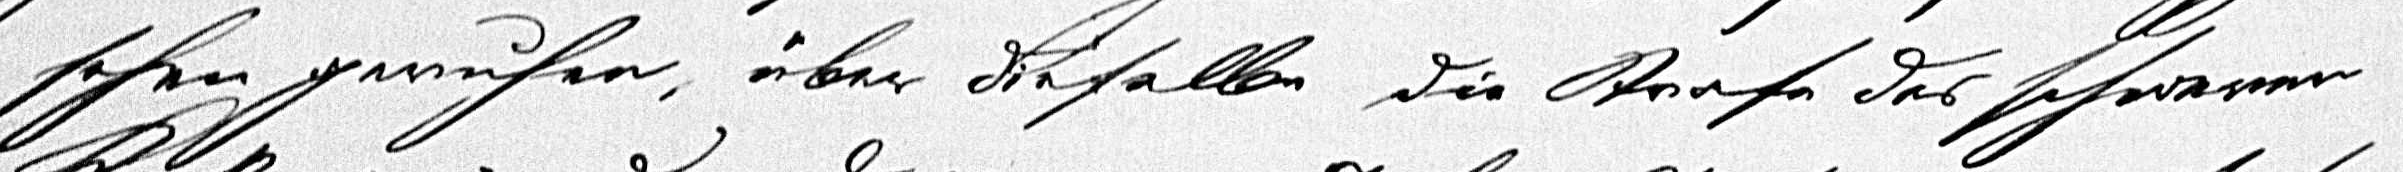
sehen geruhen, über dieselbe die Strafe des schweren
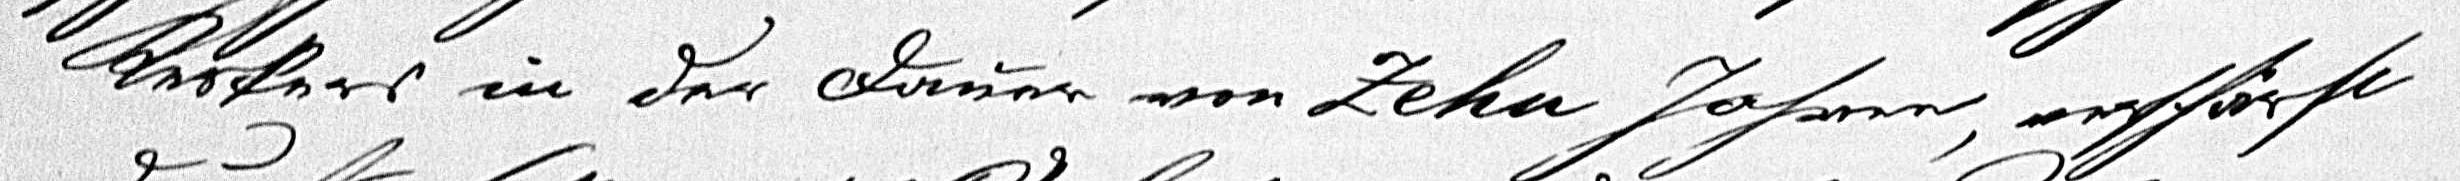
Kerkers in der Dauer von Zehn Jahren, verschärft
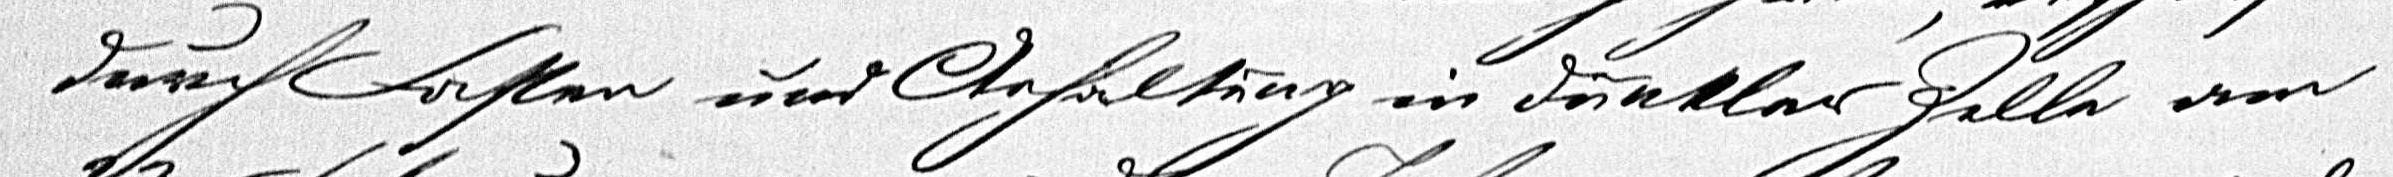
durch Fasten und Anhaltung in dunkler Zelle am
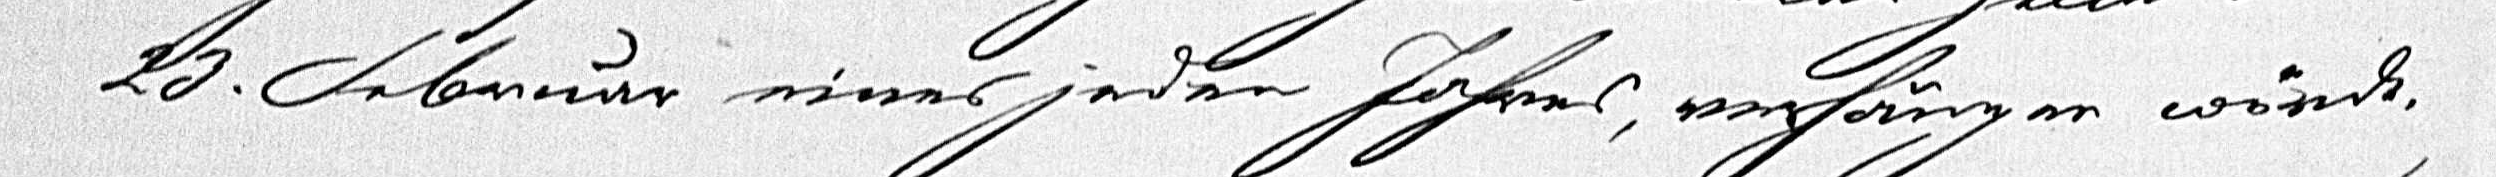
23. Februar eines jeden Jahres, verhängen würde.
